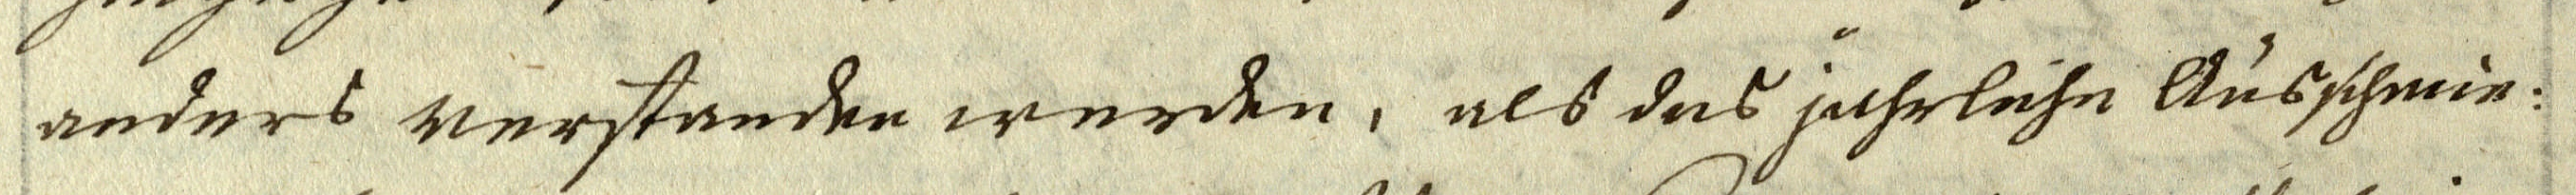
anders verstanden werden, als das jährliche Ausschmie¬
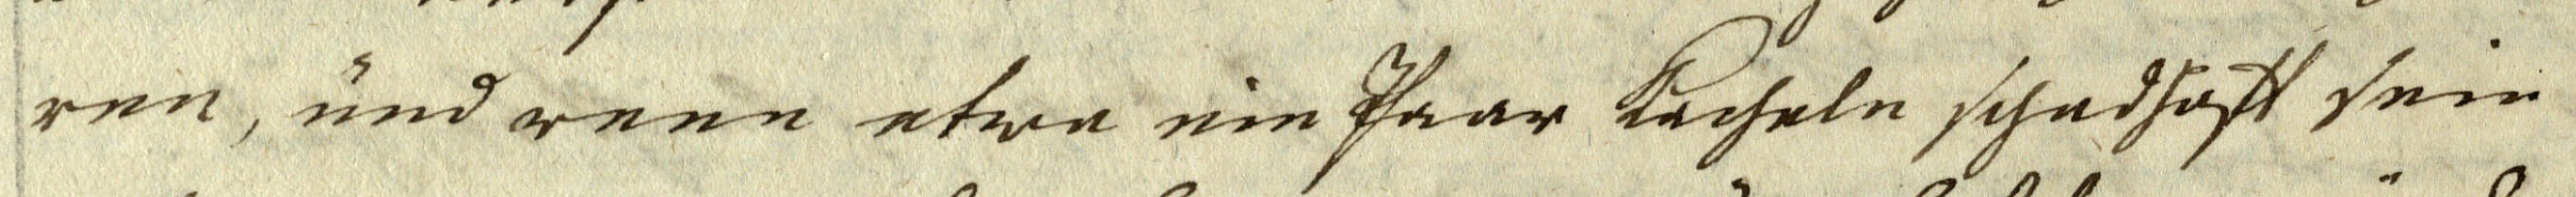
ren, und wenn etwa ein Paar Kacheln schadhaft sein
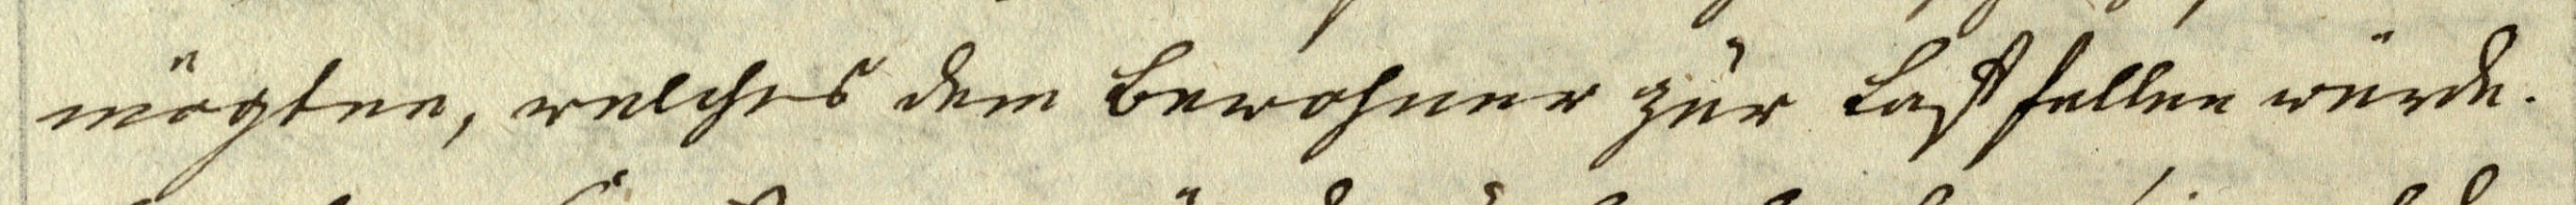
mögten, welches dem Bewohner zur Last fallen würde.
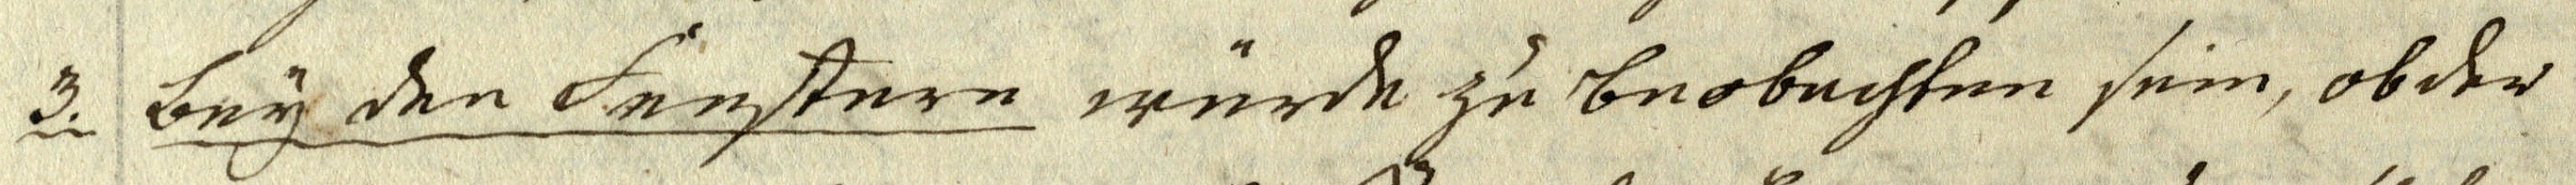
3. Beÿ den Fenstern würde zu beobachten sein, ob der
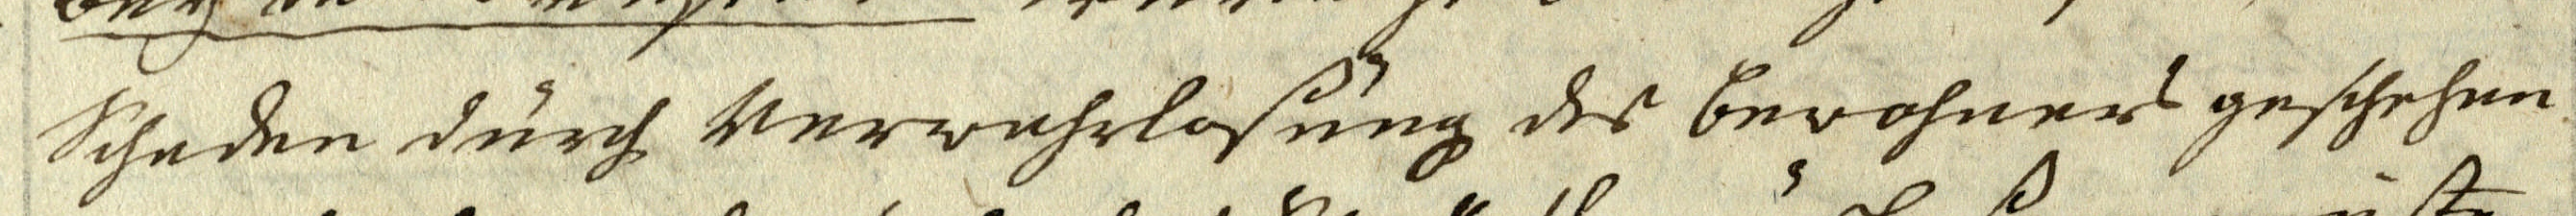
Schaden durch Verwahrlosung des Bewohners geschehen
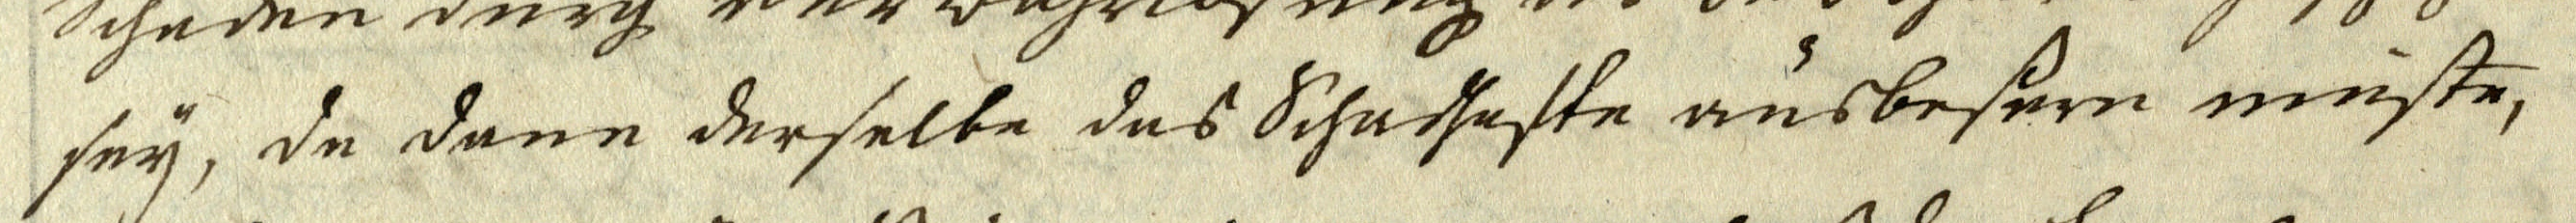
seÿ, da dann derselbe das Schadhafte ausbeßern müste,
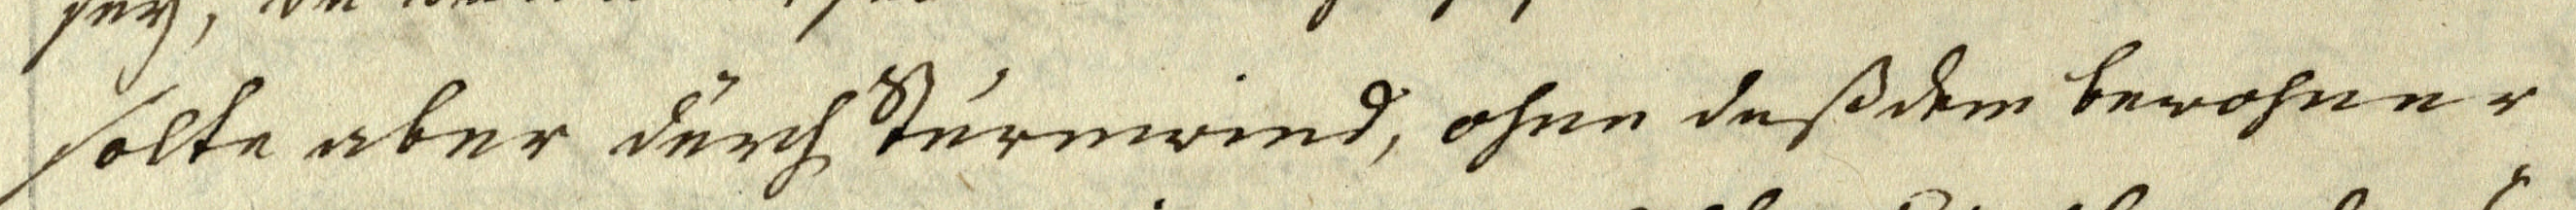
solte aber durch Sturmwind, ohn daß dem Bewohner
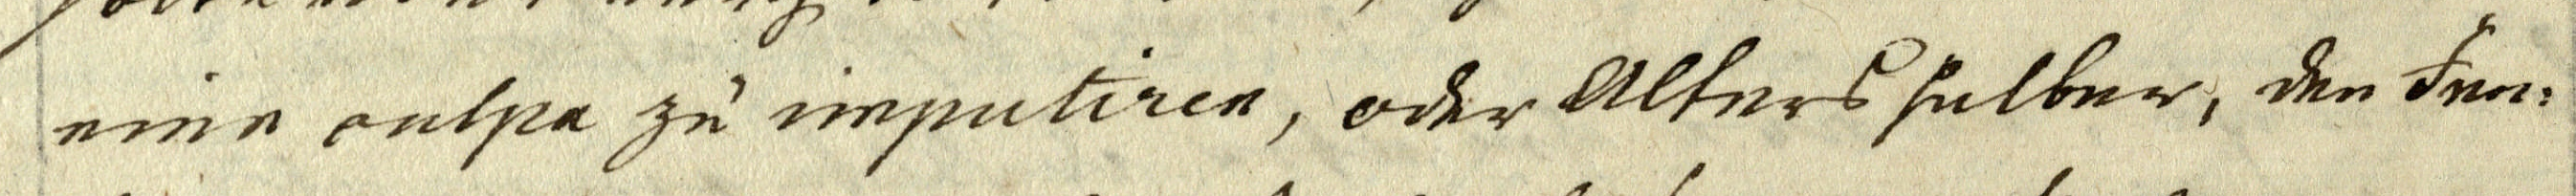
eine culpa zu imputiren, oder Alters halber, den Fen¬
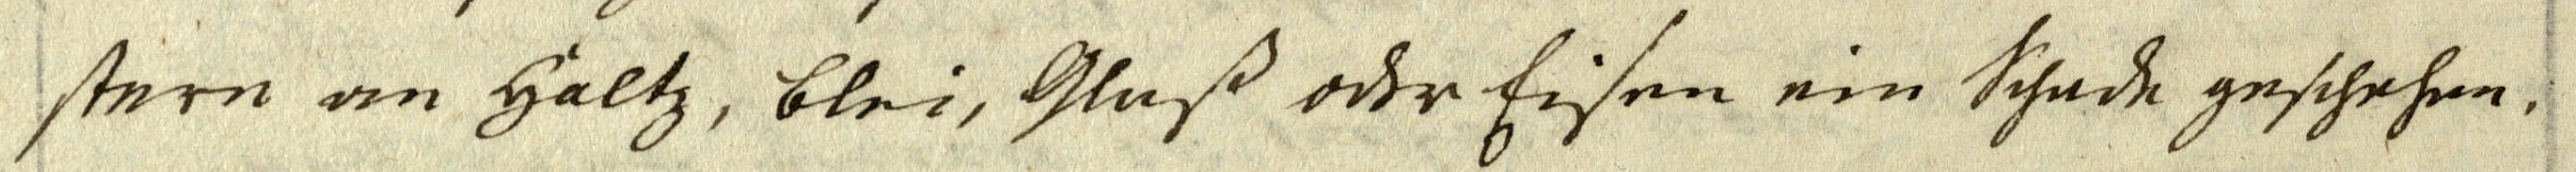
stern an Holtz, Blei, Glaß oder Eisen ein Schade geschehen,
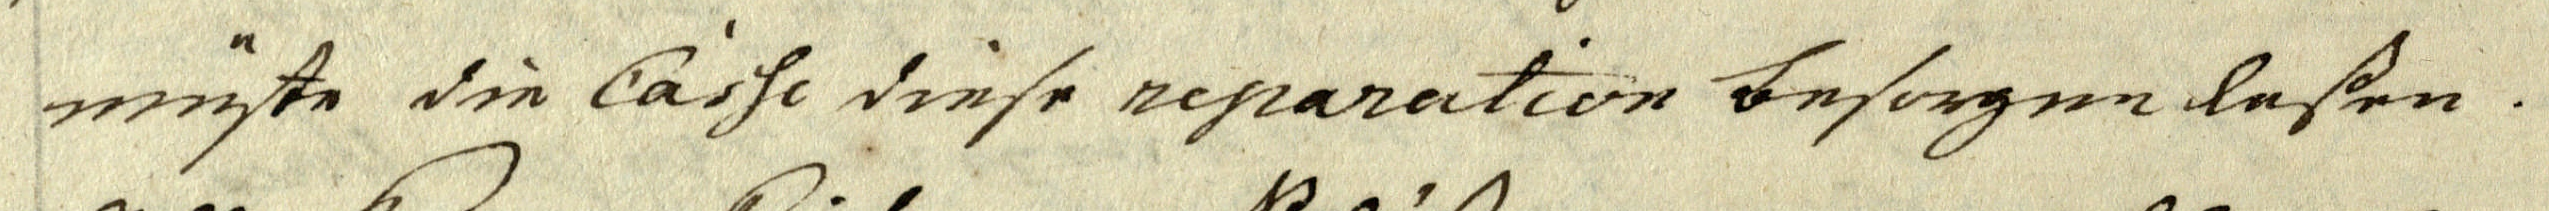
müste die Casse diese reparation besorgen laßen.
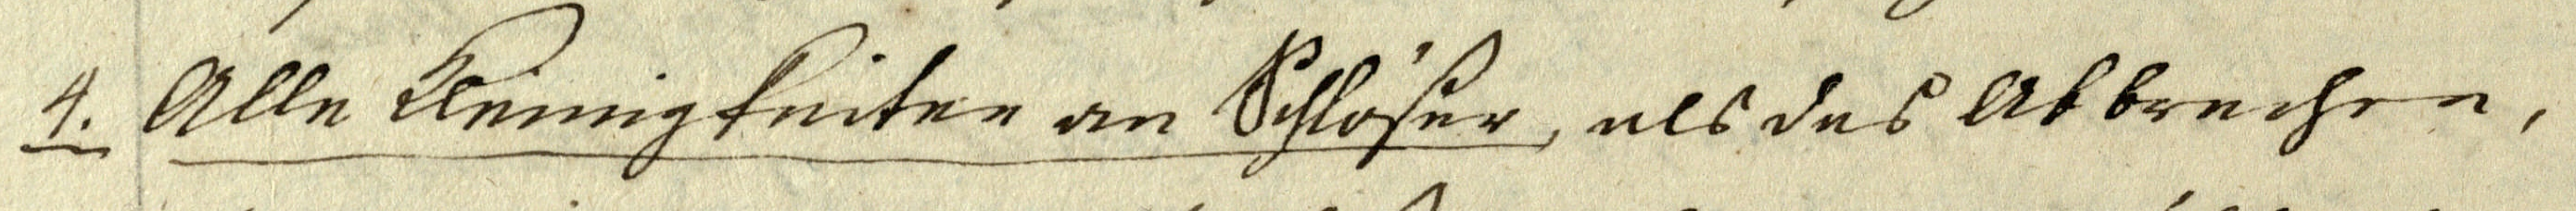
4. Alle Kleinigkeiten an Schlößer, als das Abbrechen,
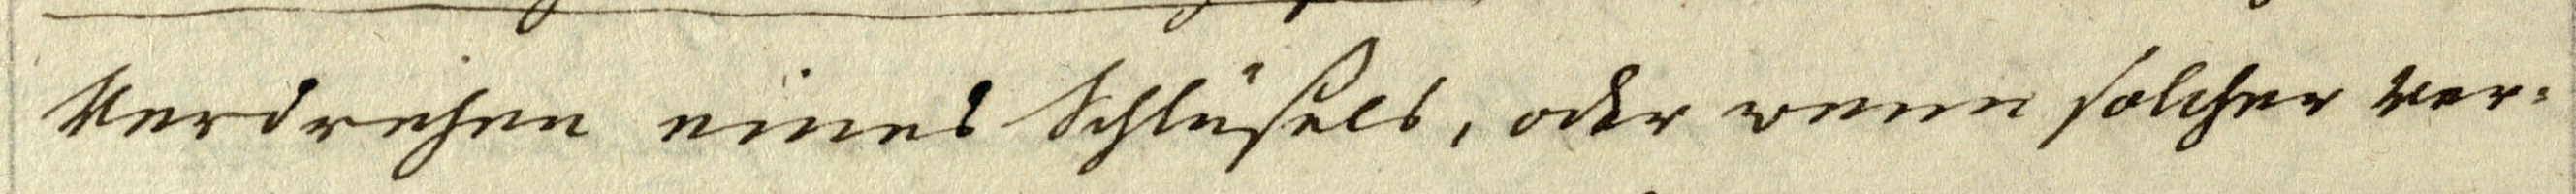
Verdrehen eines Schlüßels, oder wenn solcher ver¬
